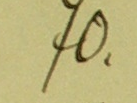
70
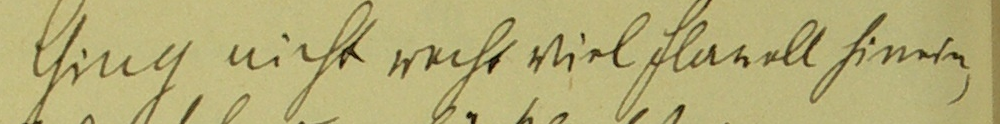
Ging nicht recht viel Flanell hinein
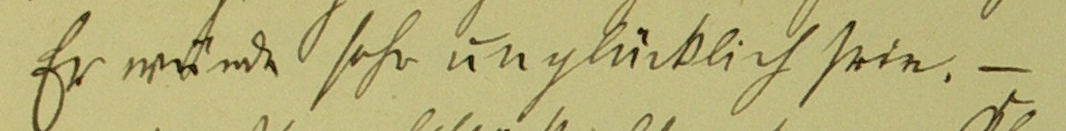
Er würde sehr unglücklich sein.-
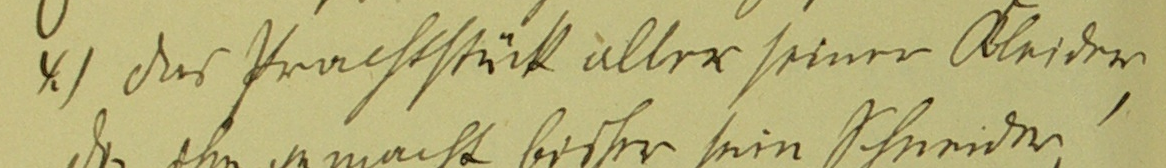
4) Das Prachtstück aller seiner Kleider
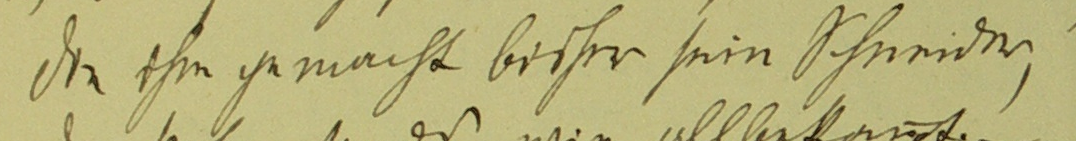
Die ihm gemacht bisher sein Schneider
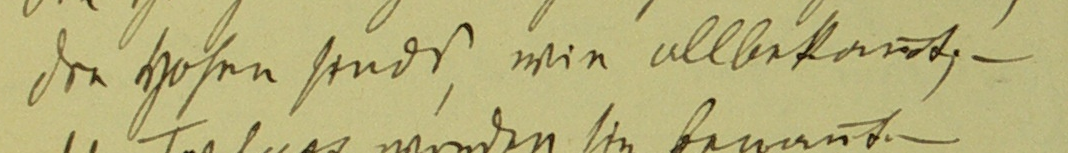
Die Hosen sinds wie allbekant
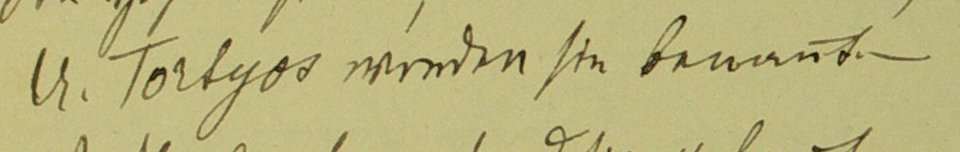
U. Tortyos werden sie benannt
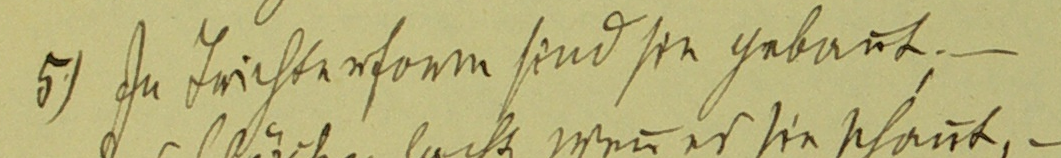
5) In Trichterform sind sie gebaut. -
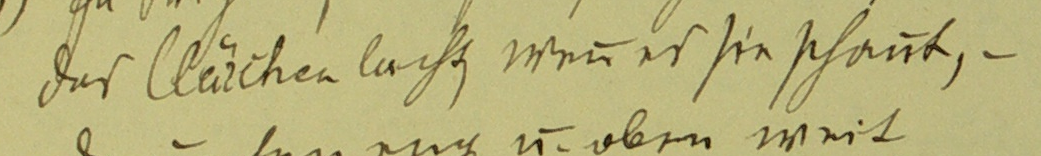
Das Clärchen lacht wen es sie schaut, -
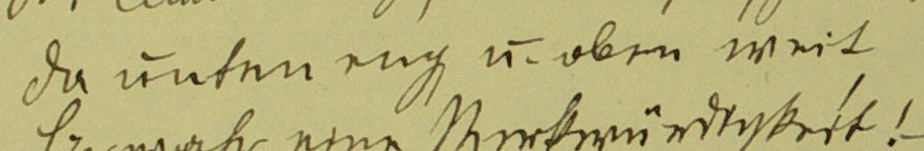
Da unten eng u. oben weit
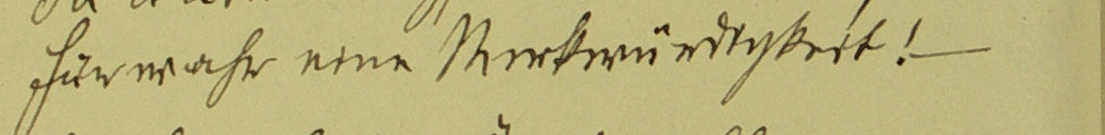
Fürwahr eine Merkwürdigkeit ! -
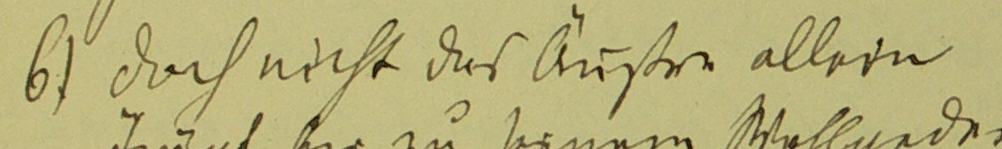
6) Doch nicht das Äußere allein
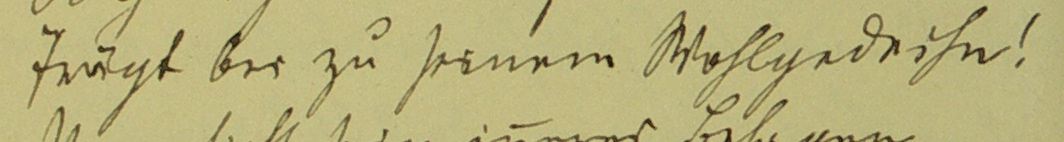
Trägt bei zu seinem Wohlgedeihn !
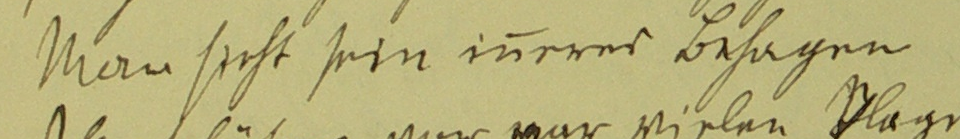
Man sieht sein ineres Behagen
